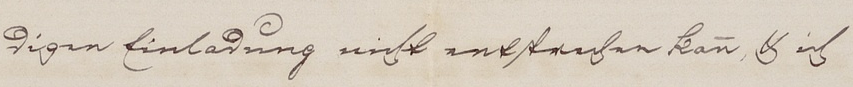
digen Einladung nicht entsprechen kann, & ich
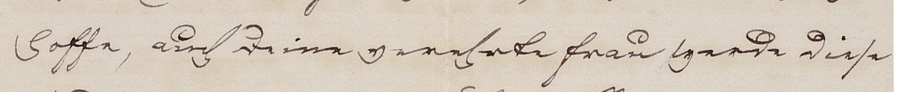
hoffe, auch Deine verehrte Frau werde diese
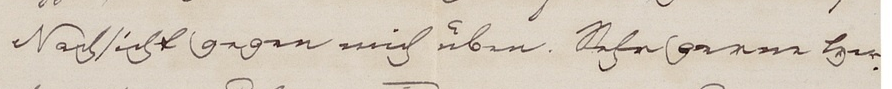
Nachsicht gegen mich üben. Sehr gerne wer-
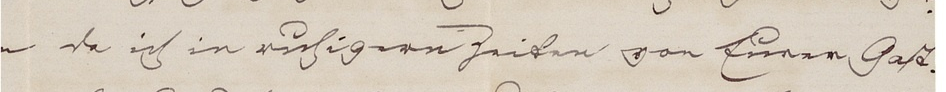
de ich in ruhigern Zeiten von Eurer Gast-
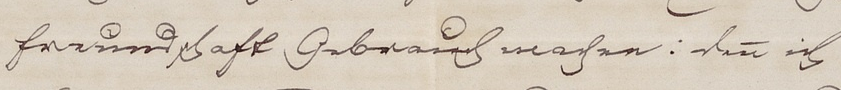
freundschaft Gebrauch machen: denn ich
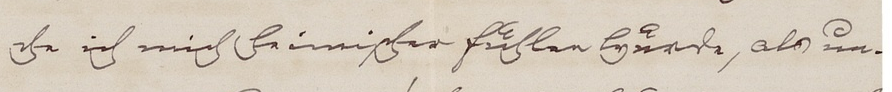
che ich mich heimischer fühlen würde, als un-
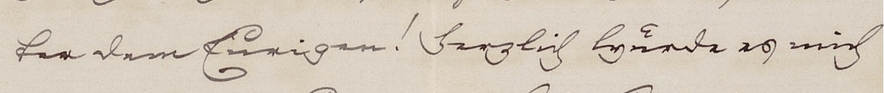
ter dem Eurigen! Herzlich würde es mich
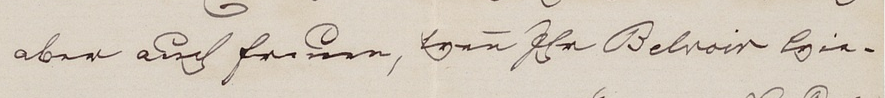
aber auch freuen, wenn Ihr Belvoir wie-
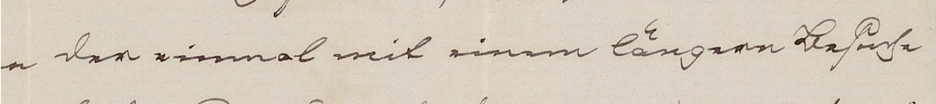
der einmal mit einem längern Besuche
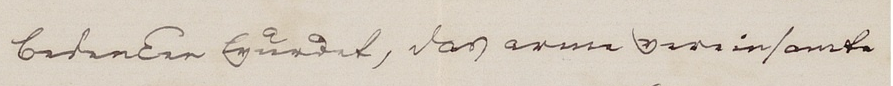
bedenken würdet, das arme vereinsamte
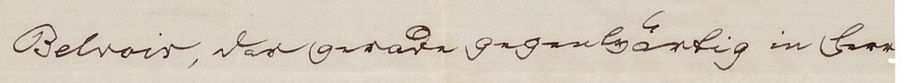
Belvoir, das gerade gegenwärtig in herr-
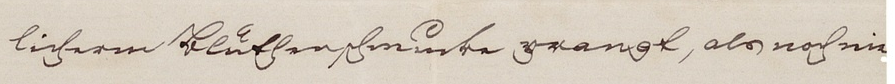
licherm Blüthenschmucke prangt, als noch nie.
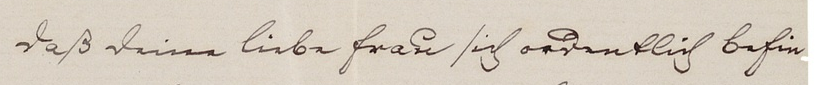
Daß Deine liebe Frau sich ordentlich befin-
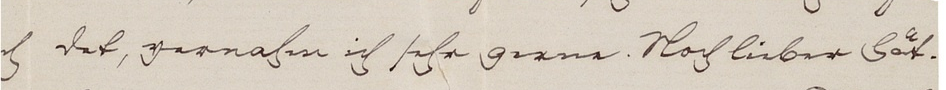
det, vernahm ich sehr gerne. Noch lieber hät-
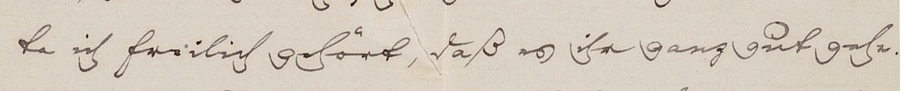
te ich freilich gehört, daß es ihr ganz gut gehe.
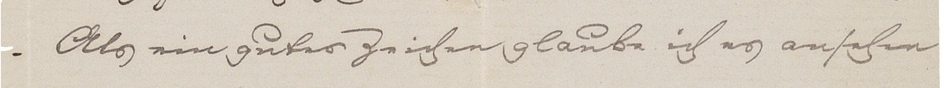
Als ein gutes Zeichen glaube ich es ansehen
